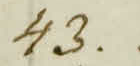43.
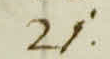21
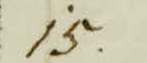15.
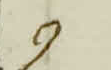9
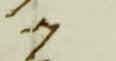7
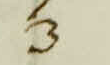3
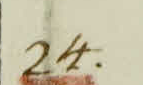24.
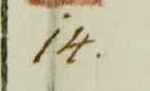14.
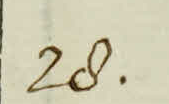28.
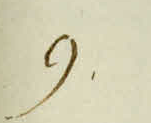9.
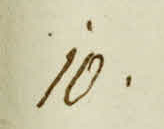10.
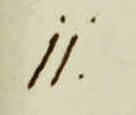11.
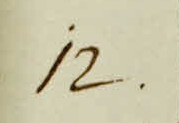12.
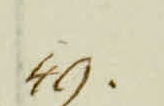49.
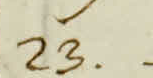23.
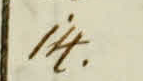14.
